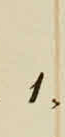1
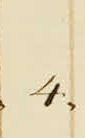4
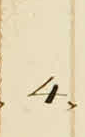4
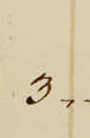3
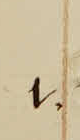1.
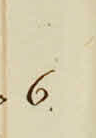6
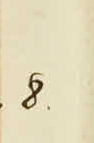8.
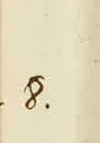8.
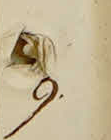9.
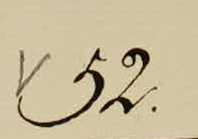52.
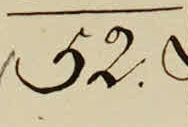52.
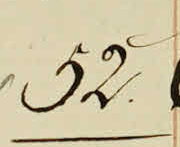52.
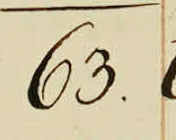63.
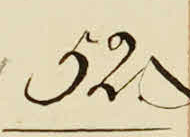52.
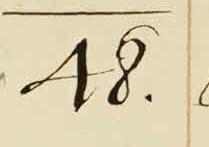48.
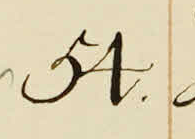54.
